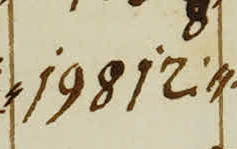19812.
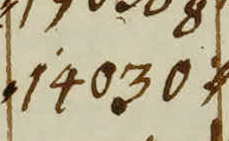14030
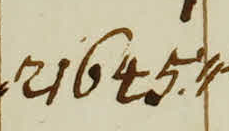21645.
